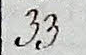33
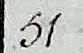51
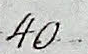40
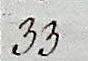33
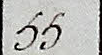55
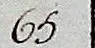65
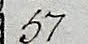57
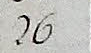26
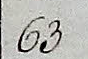63
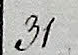31
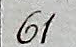61
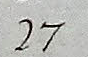27
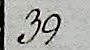39
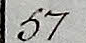57
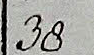38
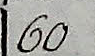60
